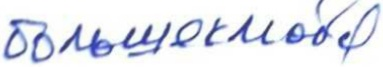большеклювя
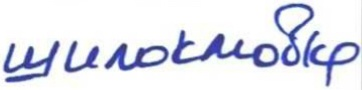шилоклювка
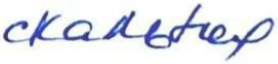скальная
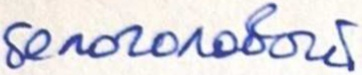белоголовый
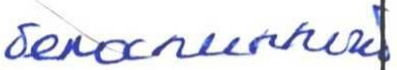белоспинный
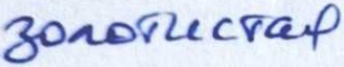золотистая
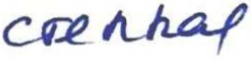степная
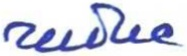чибис
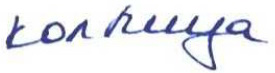колпица
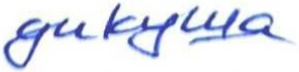дикуша
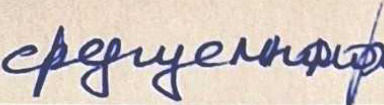средиземномор
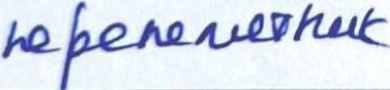перепелятник
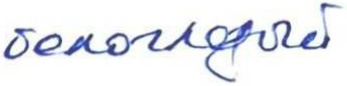белоглозый
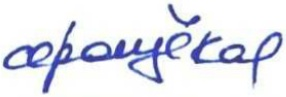серощёкая
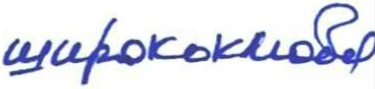ширококлювя
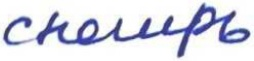снегирь
